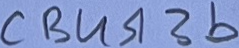свиязь
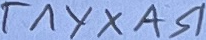глухая
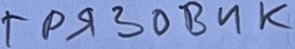грязовик
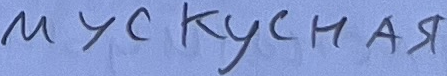мускусная
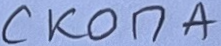скопа
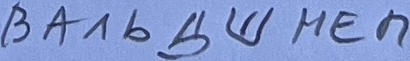вальдшнеп
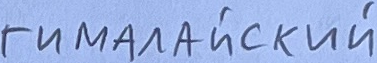гималайский
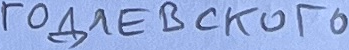годлевского
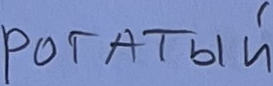рогатый
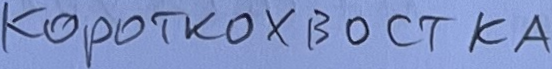короткохвостка
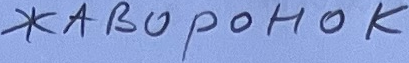жаворонок
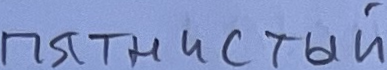пятнистый
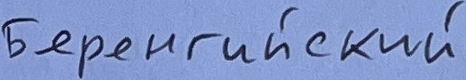беренгийский
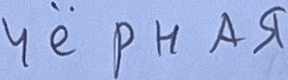чёрная
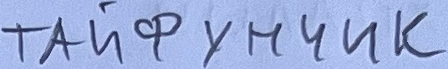тайфунчик
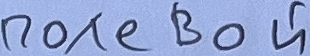полевой
